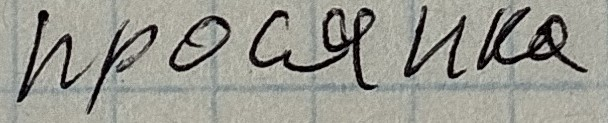просянка
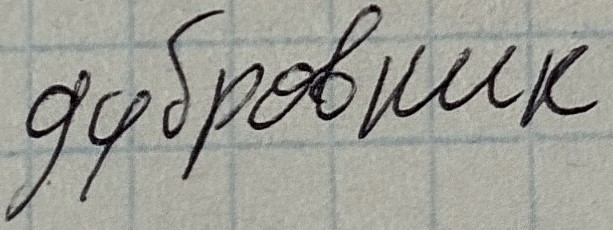дубровник
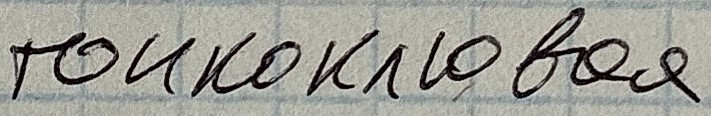тонкоклювая
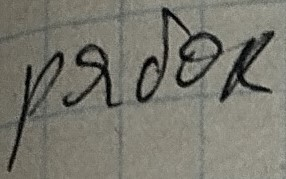рябок
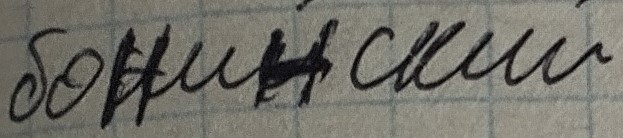бонинский
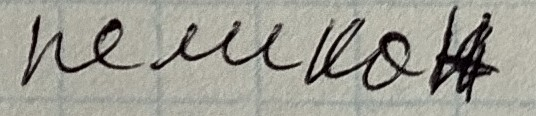пеликан
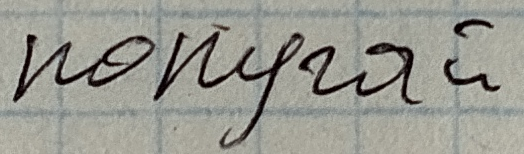попугай
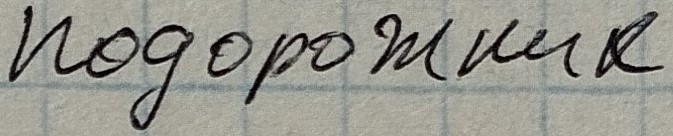подорожник
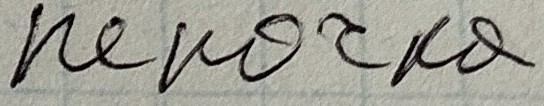пеночка
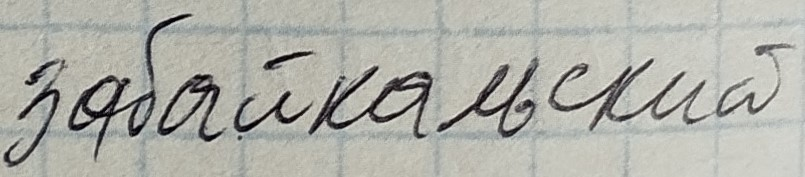забайкальский
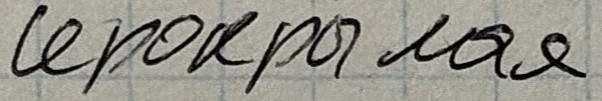серокрылая
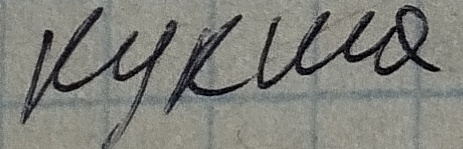кукша
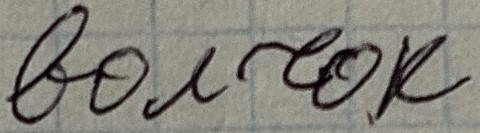волчок
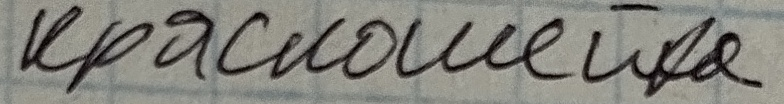красношейка
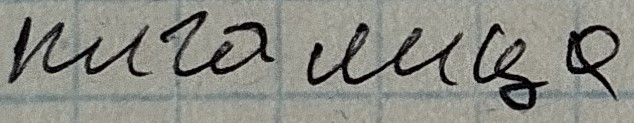пигалица
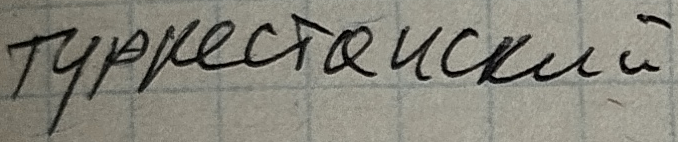туркестанский
